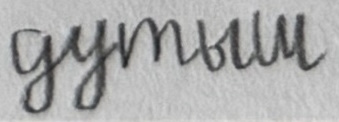дутыш
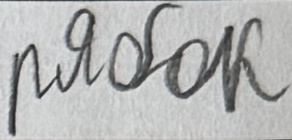рябок
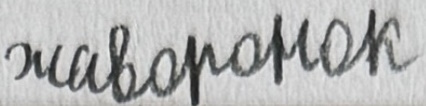жаворонок
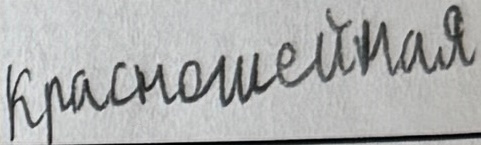красношейная
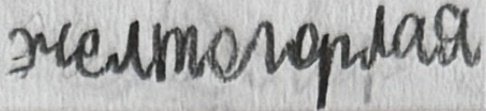желтогорлая
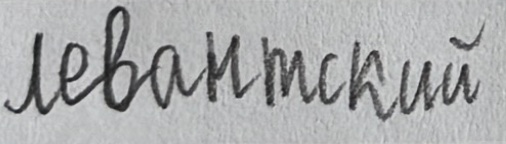левантский
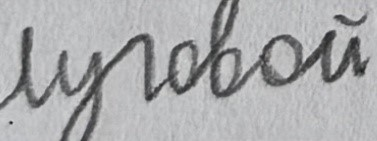луговой
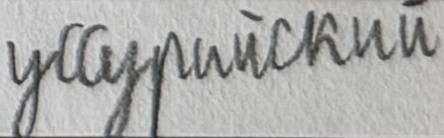уссурийский
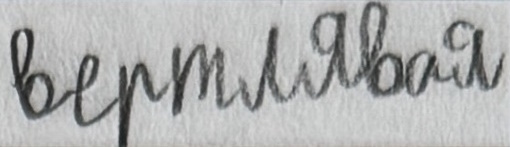вертлявая
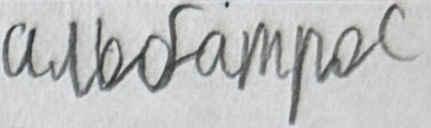альбатрос
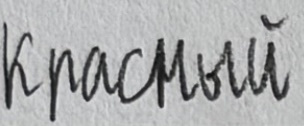красный
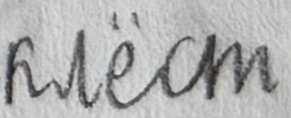клёст
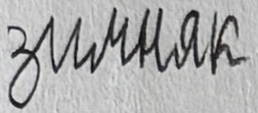зимняк
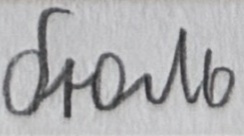бюль
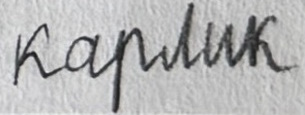карлик
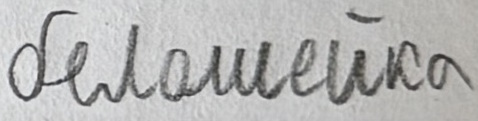белошейка
